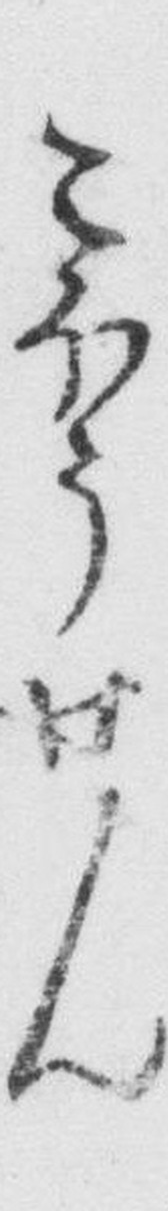こ不うせん
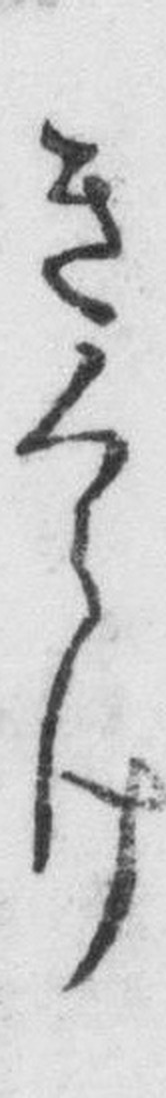きくらけ
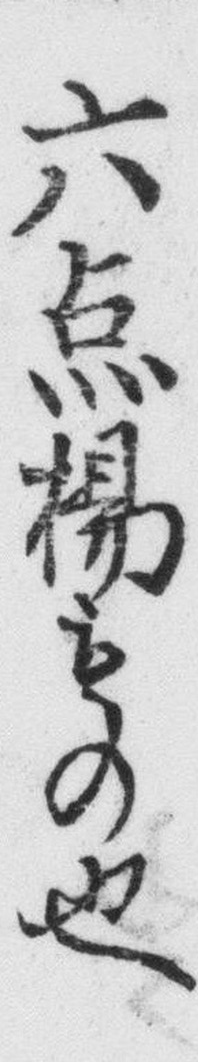六点揚もの也
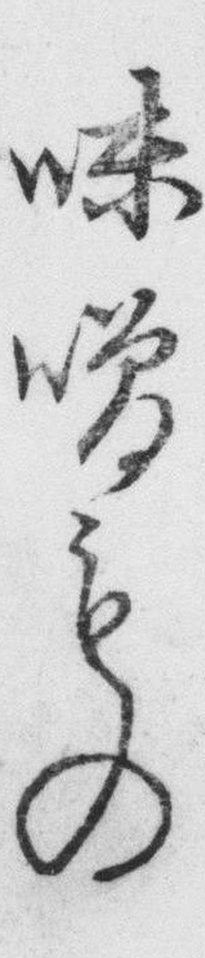味噌もの
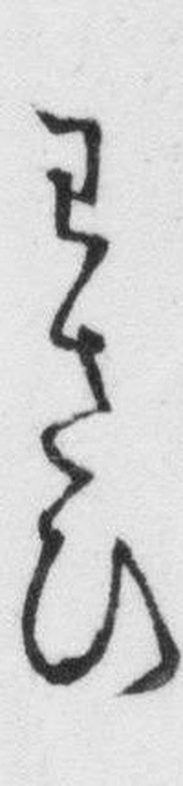わさひ
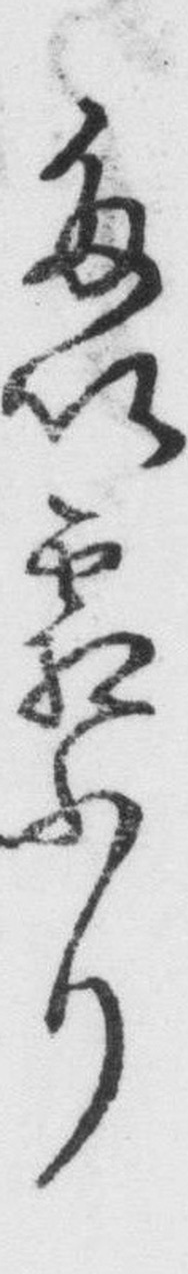多以霜ふり
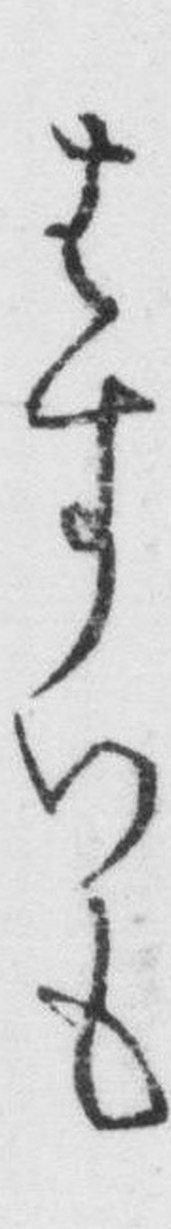はすいも

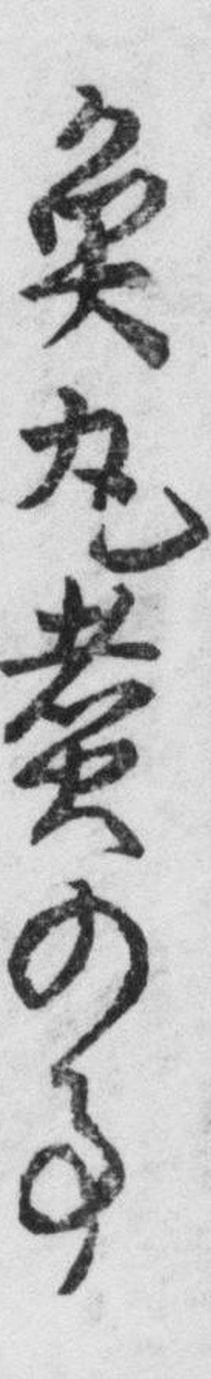魚丸煮の事
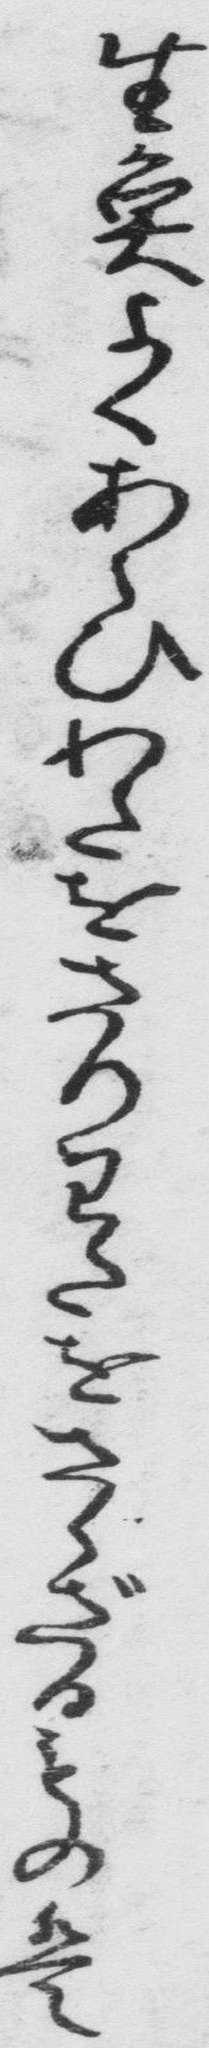生魚よくあらひわたをさりわたをさらざるもの盤
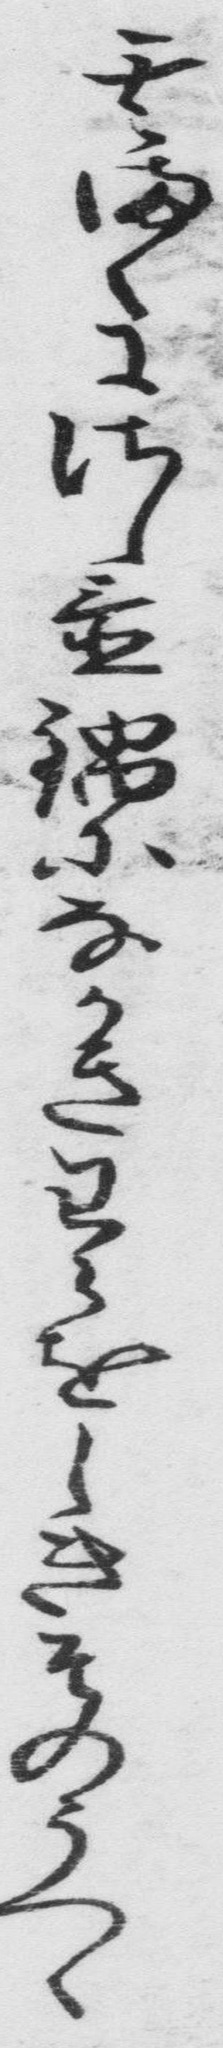其満々尓佐し置鍋尓なかきわらをしきそのうへゝ
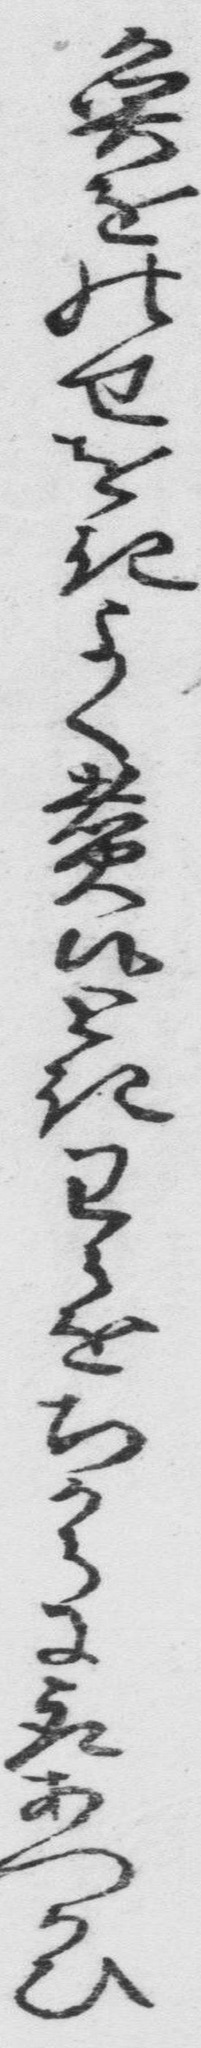魚を能せを起よく煮候と起わらをちかう尓取あつかひ
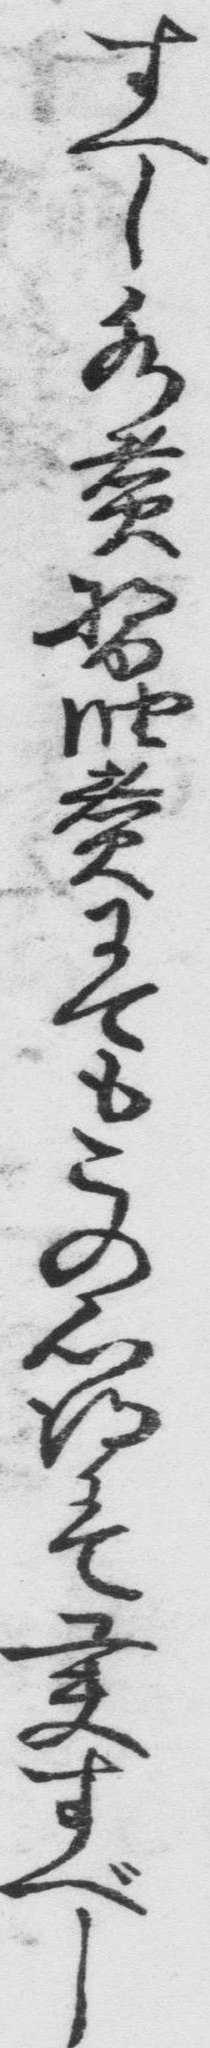すへし水煮醤油煮尓てもこの心得尓て工夫すべし
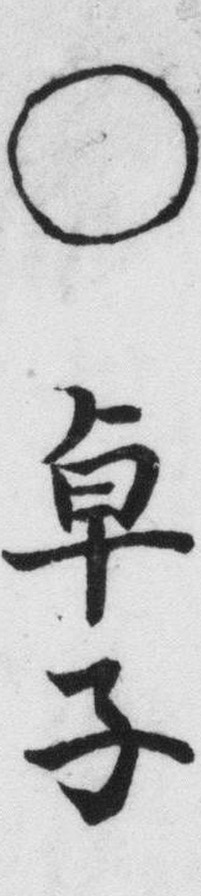〇卓子
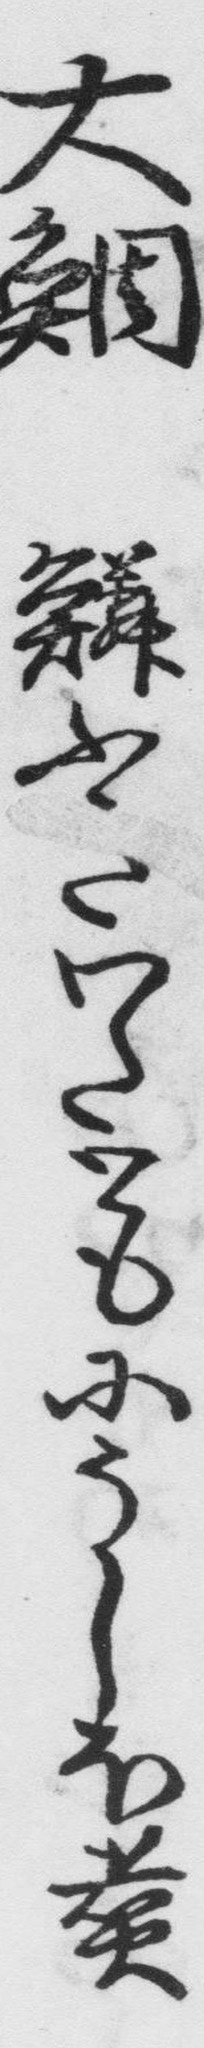大鯛鱗ふたわたとも尓うし不煮
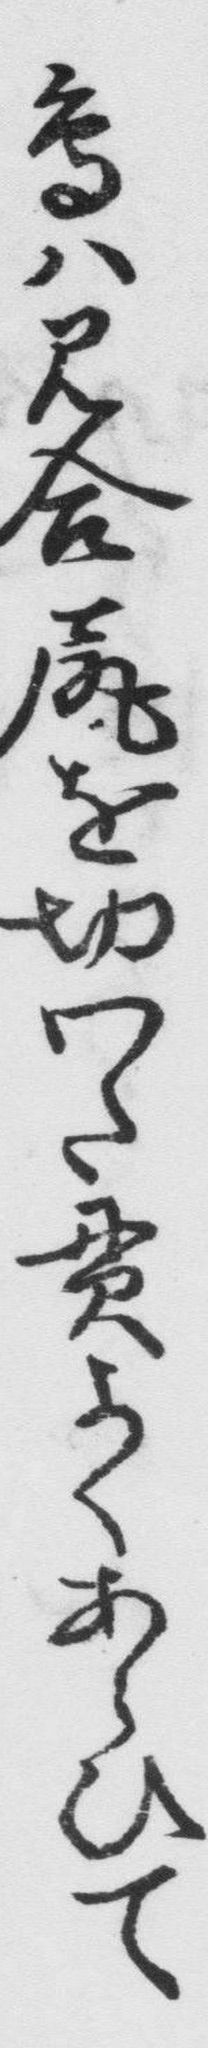鳥は見合尻を切わた貫よくあらひて
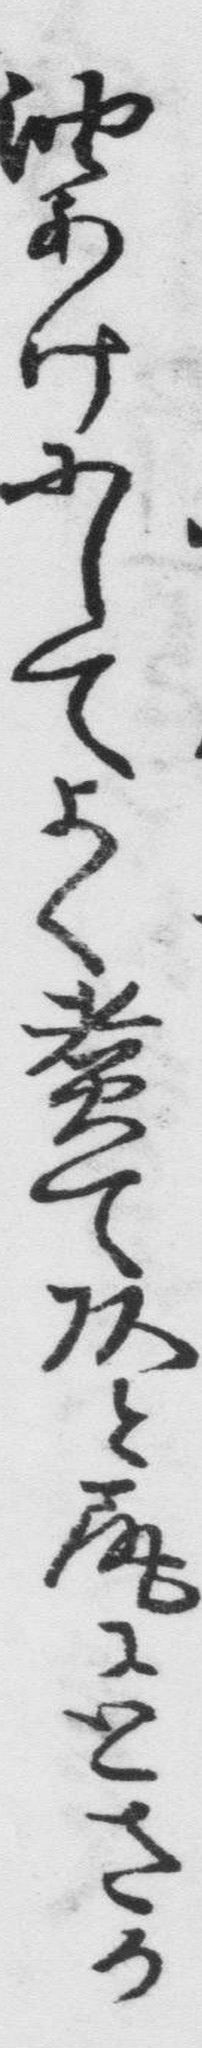金鶏油あけ尓してよく煮て頭と尻尓とさか
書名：普茶料理抄
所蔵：大阪府立大学学術情報センター 国文学研究資料館
